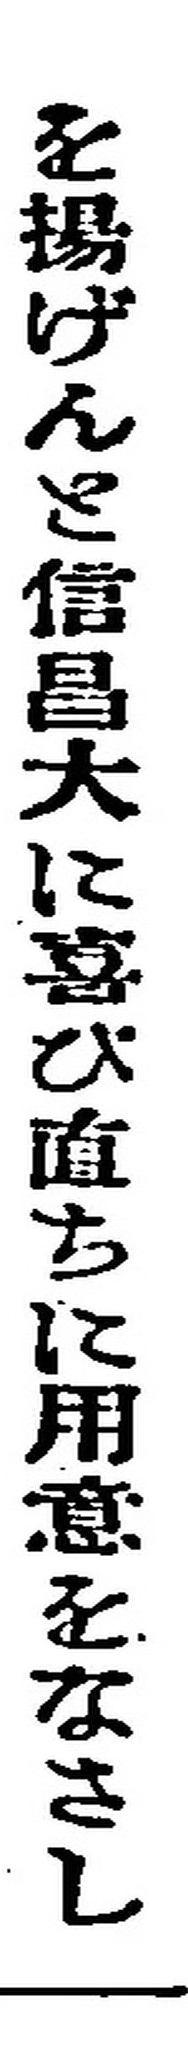を揚げんと信昌大に喜び直ちに用意をなさし
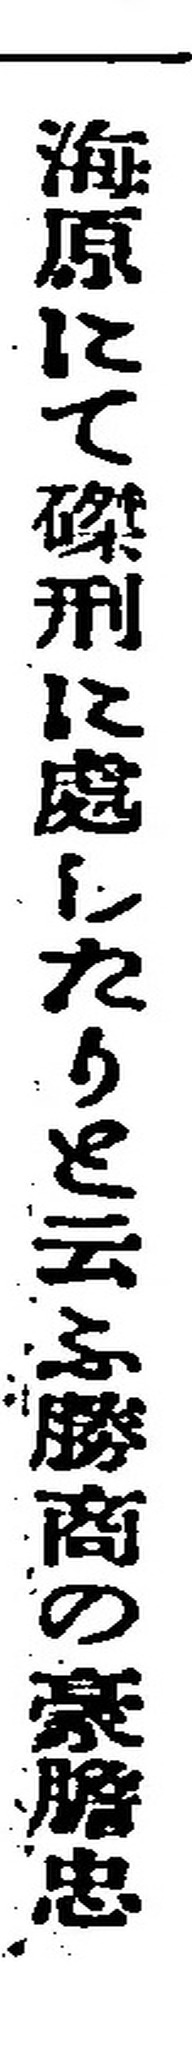海原にて磔刑に処したりと云ふ勝商の豪胆忠
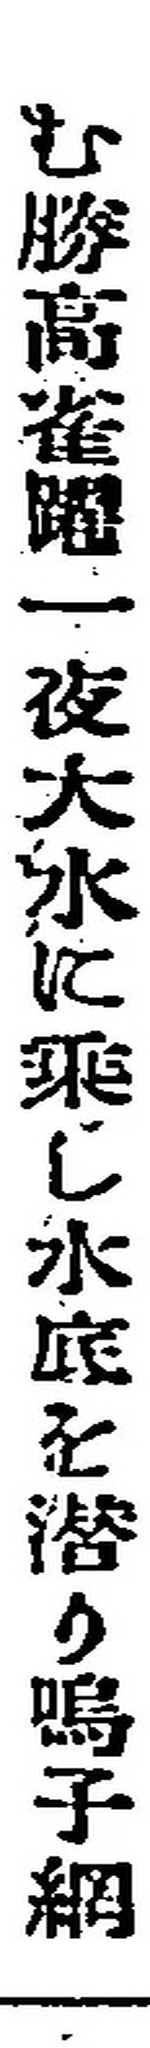む勝高雀躍一夜大水に乗し水底を潜り嗚子網
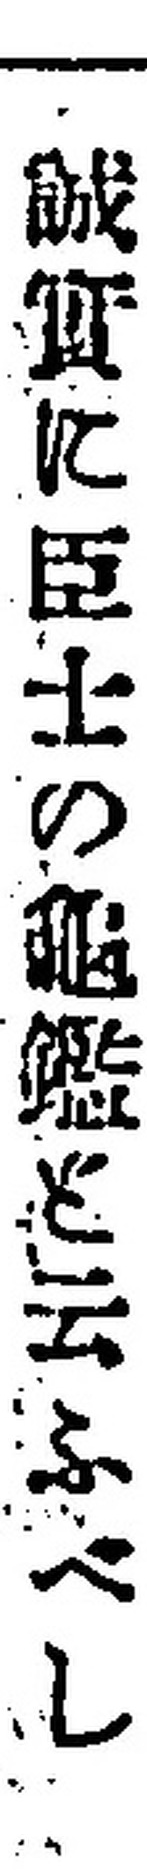誠実に臣士の亀鑑と云ふべし
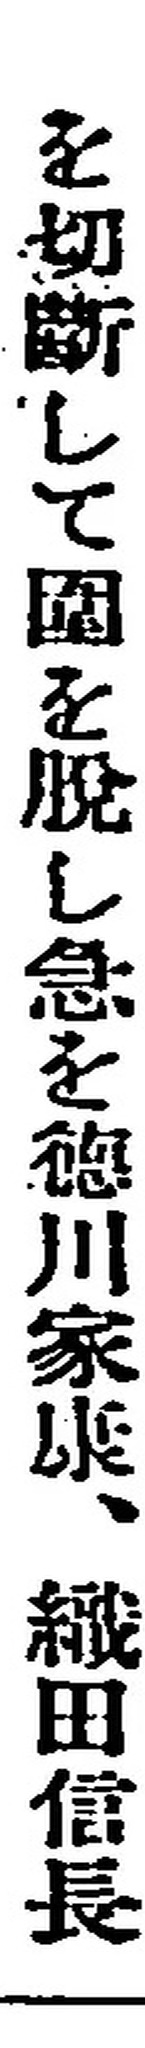を切断して囲を脱し急を徳川家康、織田信長
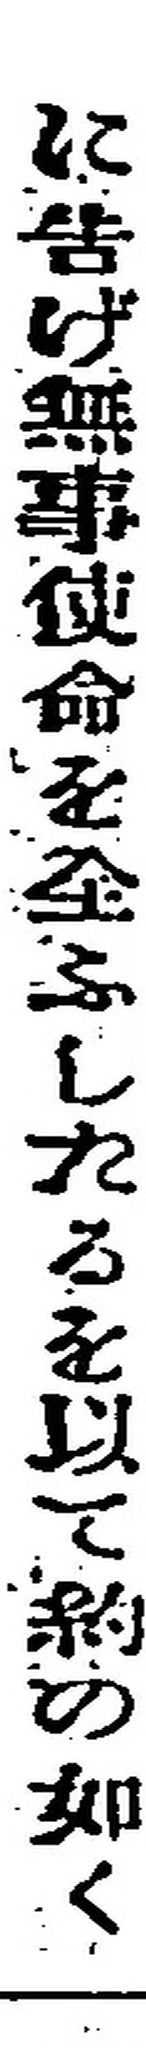に告げ無事使命を全うしたるを以て約の如く
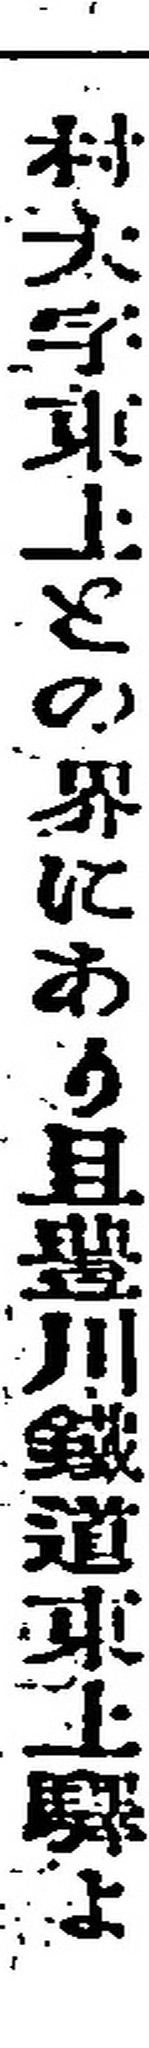村大字東上との界にあり且豊川鉄道東上駅よ
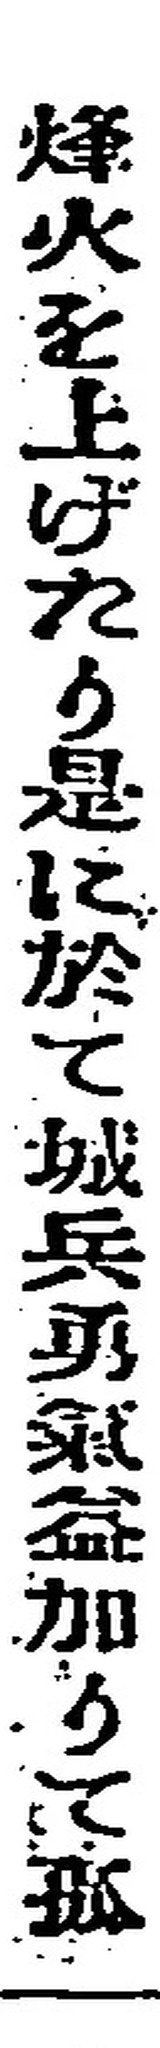烽火を上げたり是に於て城兵勇気益加りて孤
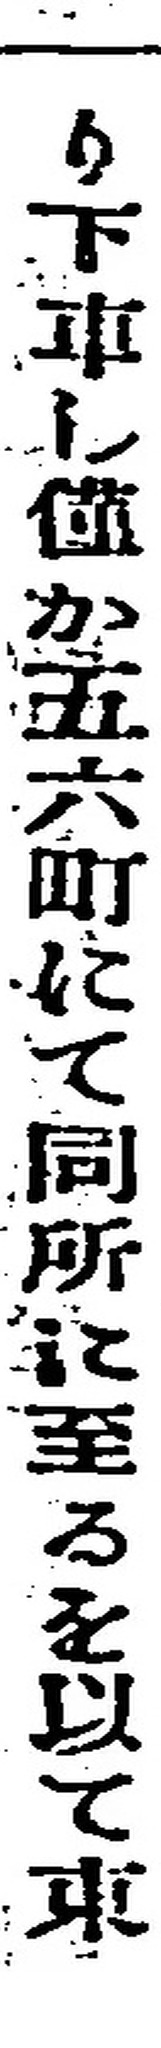り下車し僅か五六町にて同所に至るを以て東
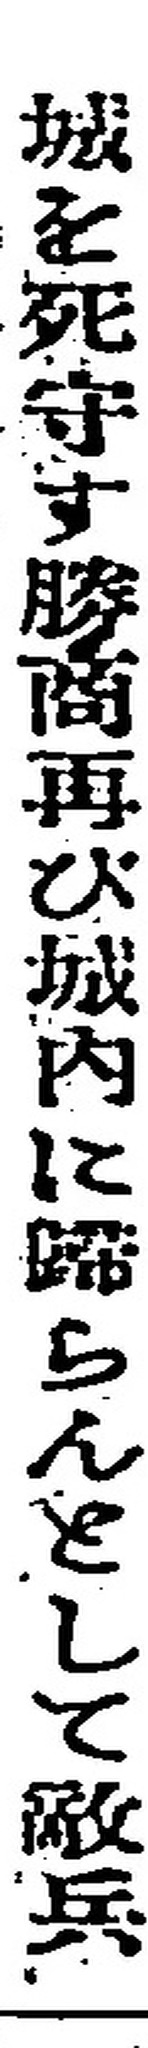城を死守す勝商再び城内に帰らんとして敵兵
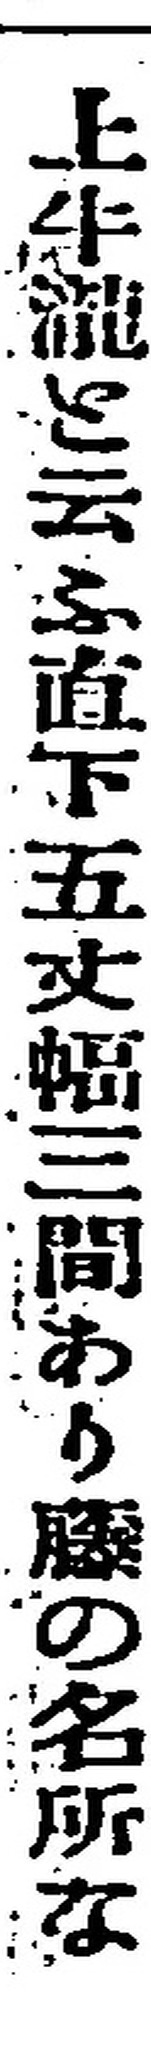上牛瀧と云ふ直下五丈幅三間あり藤の名所な
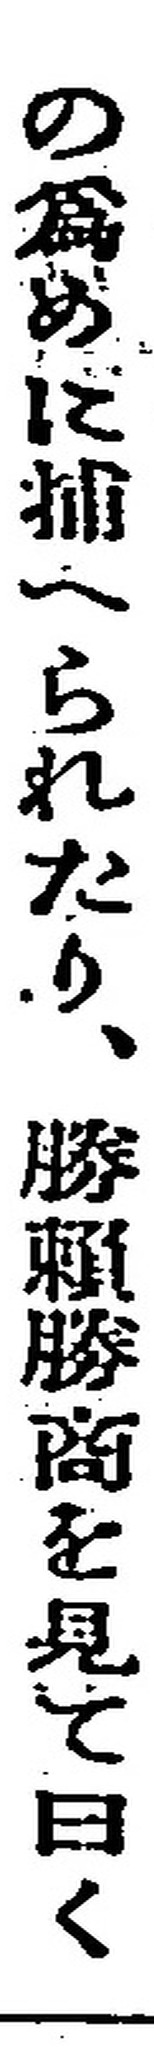の為めに捕へられたり、勝頼勝商を見て曰く
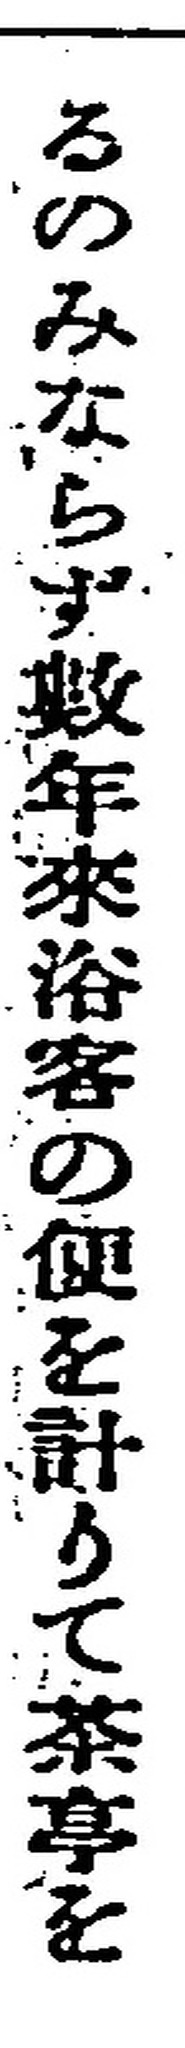るのみならず数年来浴客の便を計りて茶亭を
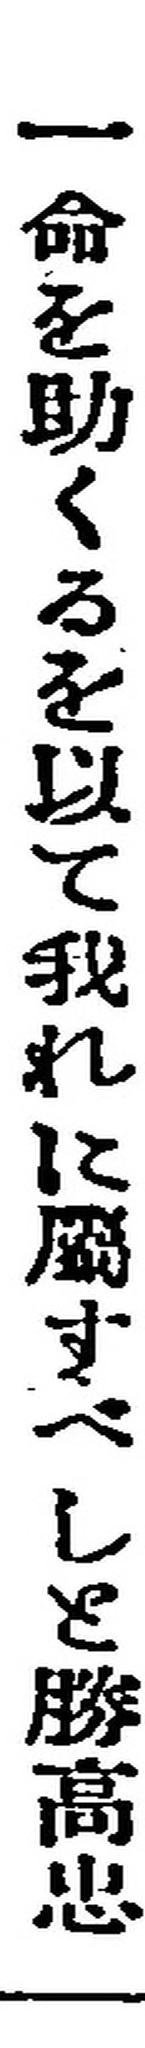一命を助くるを以て我れに属すべしと勝高忠
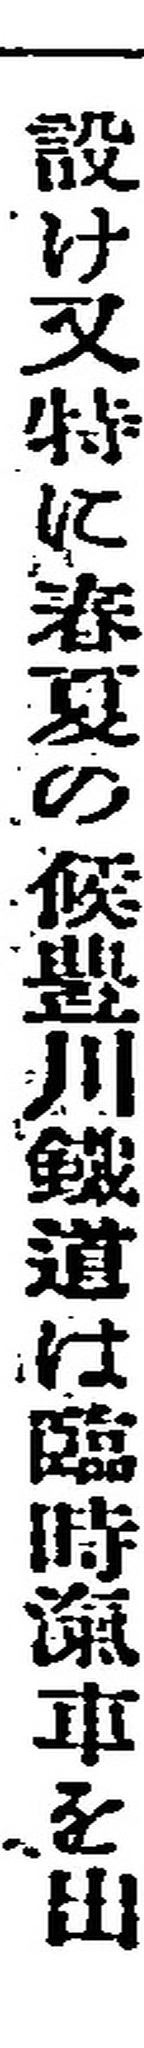設け又特に春夏の候豊川鉄道は臨時汽車を出
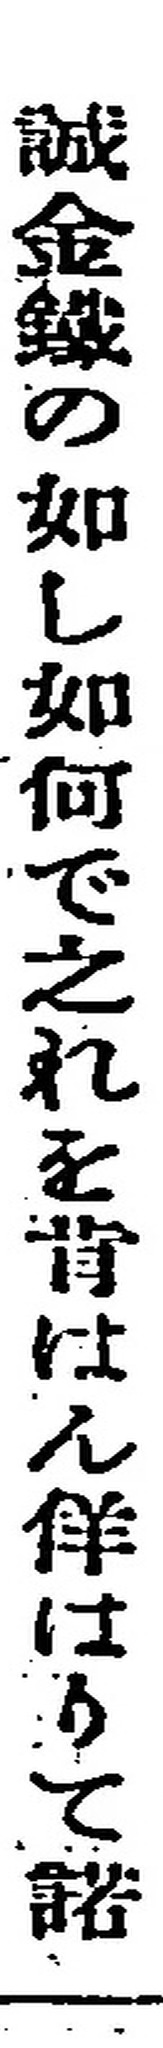誠金鉄の如し如何で之れを肯はん佯はりて諾
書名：東参名勝案内
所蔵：国立国会図書館 National Diet Library, JAPAN
